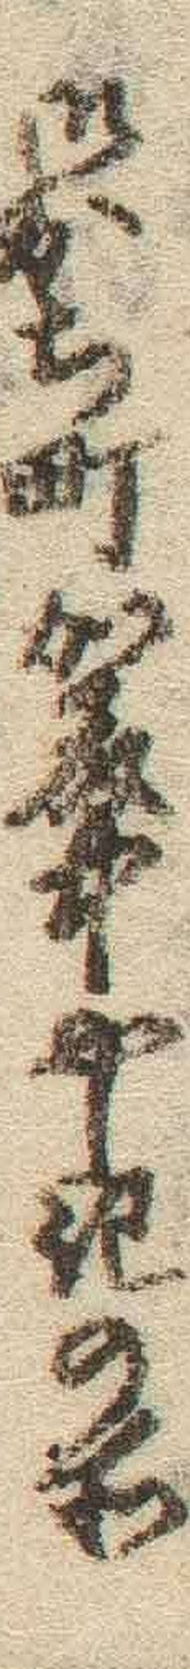御かち町加藤中やしきの所
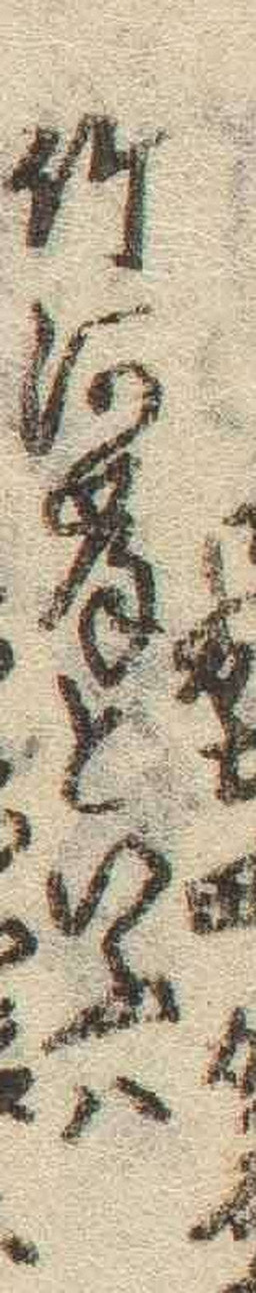竹河岸といふは
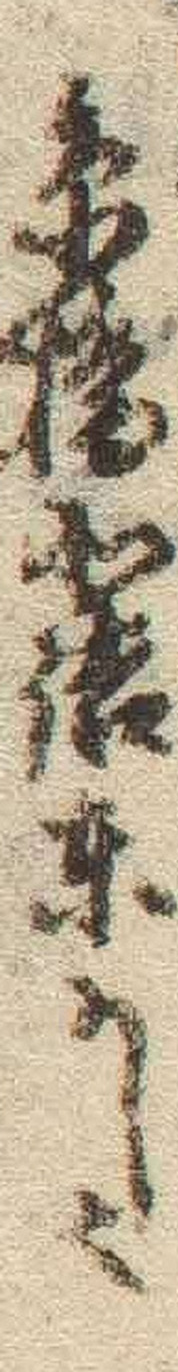京橋北詰東かし也
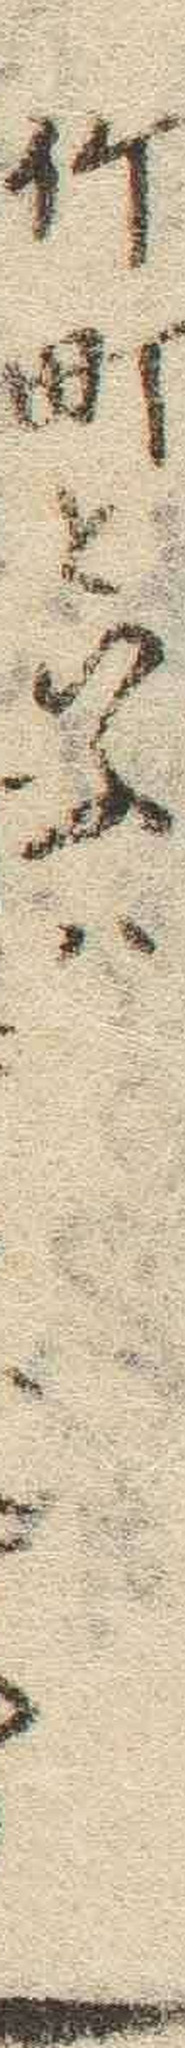竹町といふは
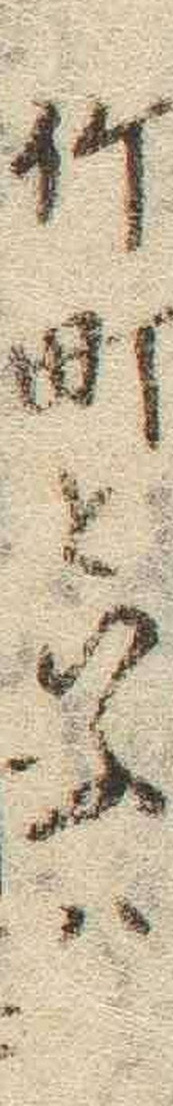竹町といふは
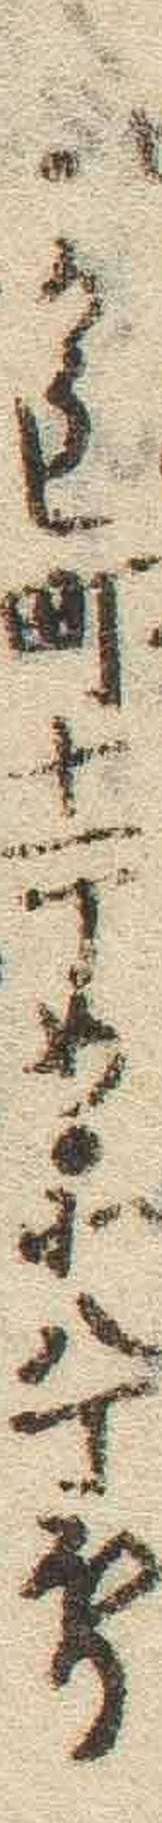・かうし町十一丁め・北八丁ほり
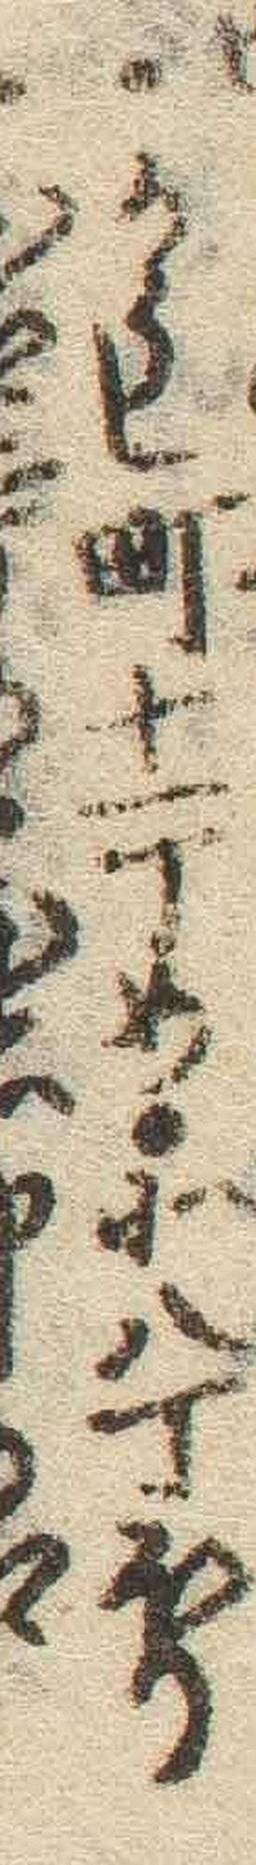・かうし町十一丁め・北八丁ほり
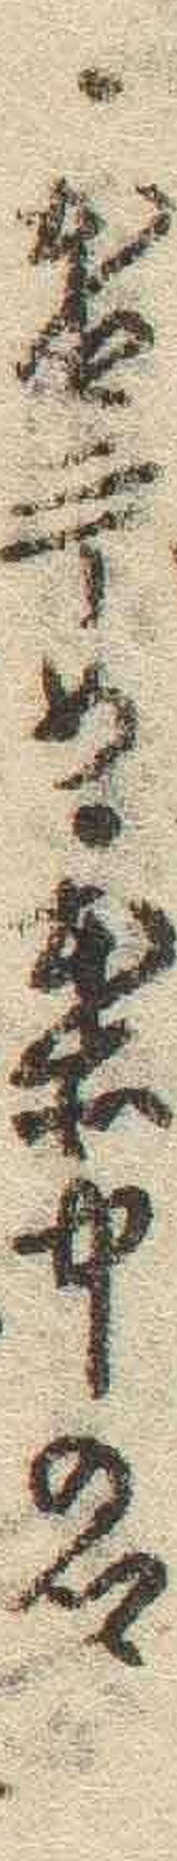・本郷二丁め・本所中の郷
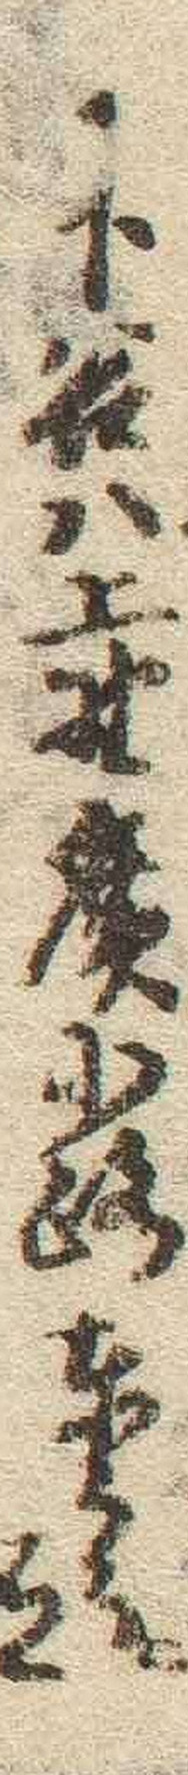・下谷は上野広小路東かはに有
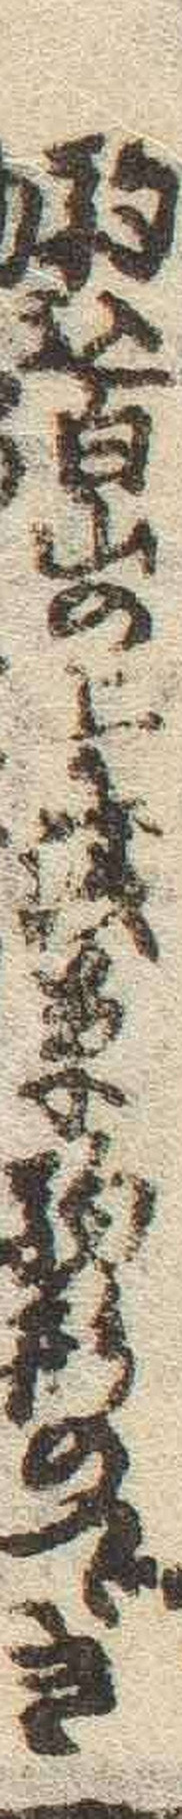駒込白山の上浅草駒形のつゞき
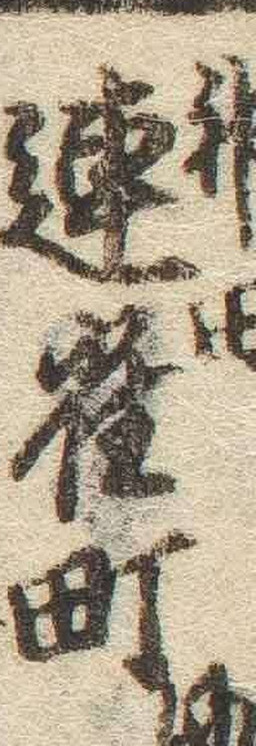連雀町
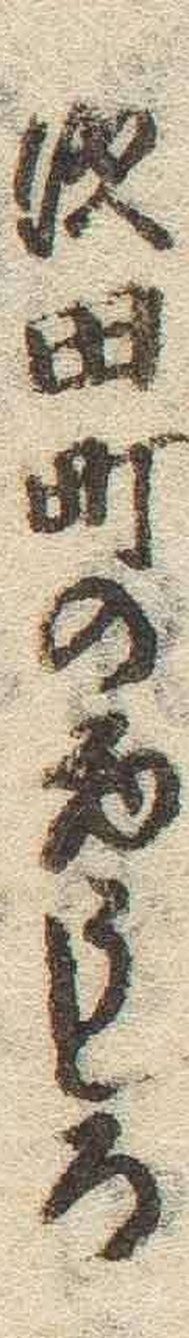須田町の西うしろ
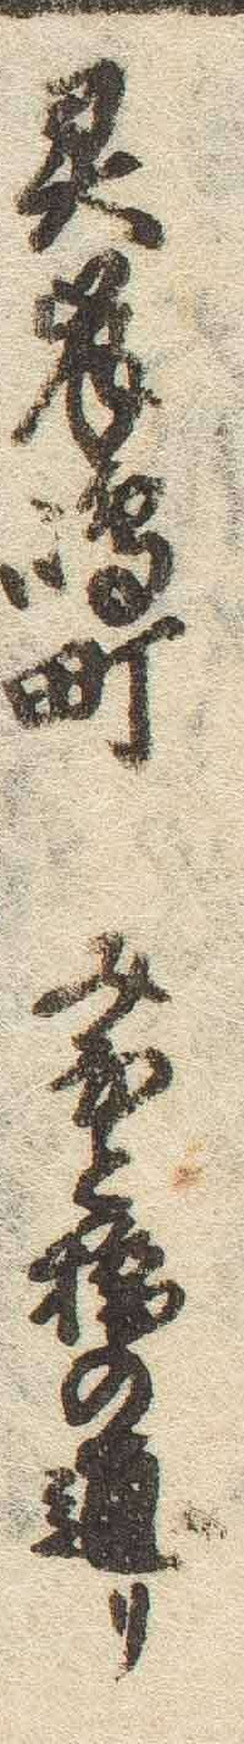霊岸島町みなと橋の通り
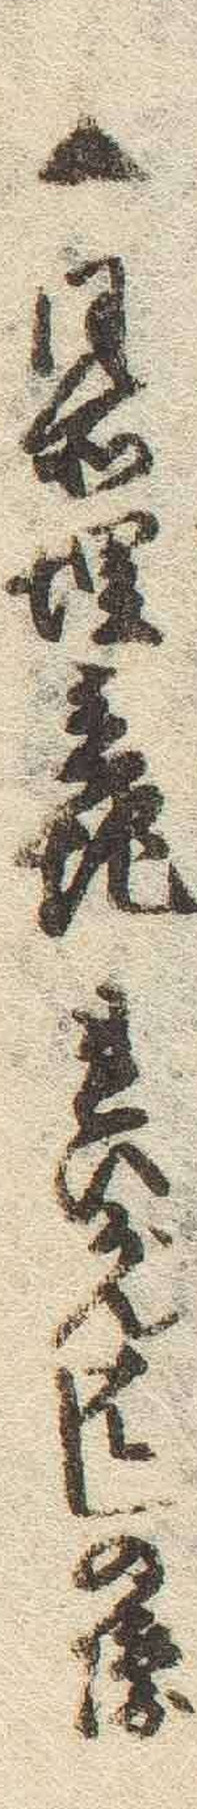▲同所埋立地れいがんはしの際
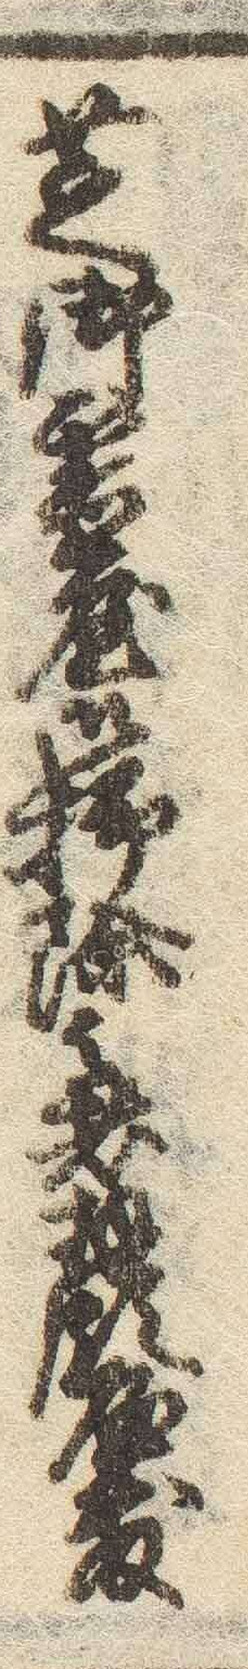芝御霊屋御掃除之者拝領屋敷
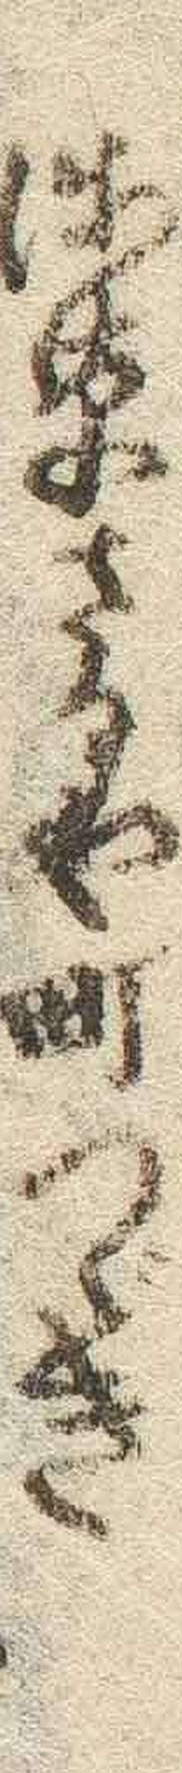浅草さるや町つゞき
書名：江戸町独案内
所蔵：東京学芸大学附属図書館 国文学研究資料館
